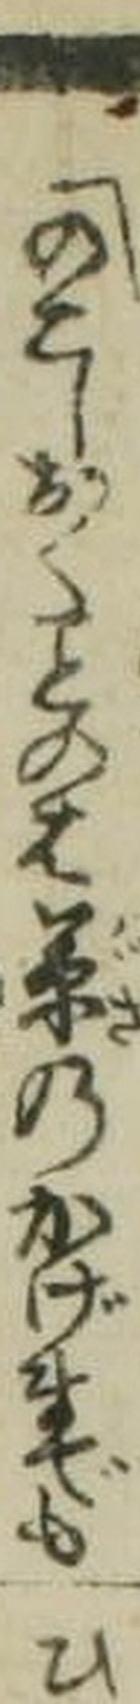〽のこしおくことのは草のかげまでも
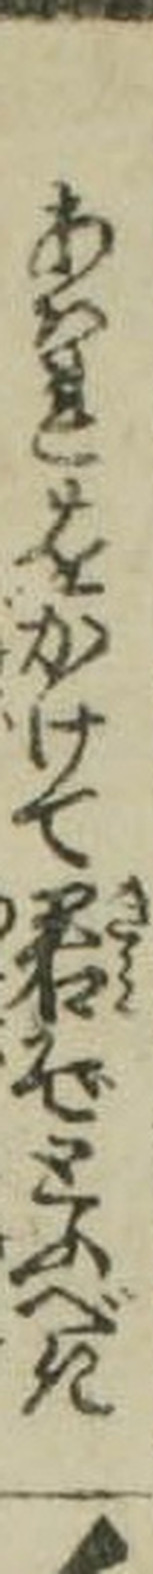あはれをかけて君ぞとふべき
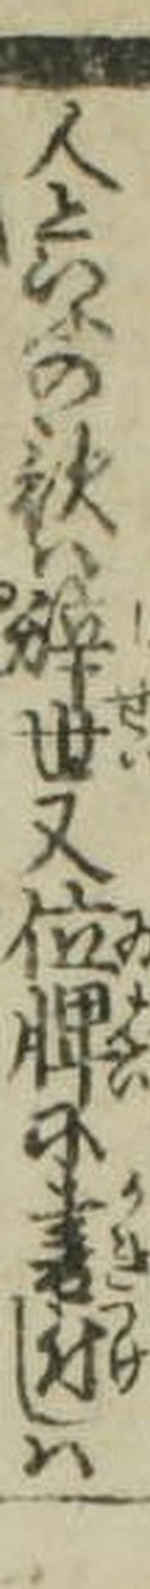人といふの歌は辞世又位牌に書付しは
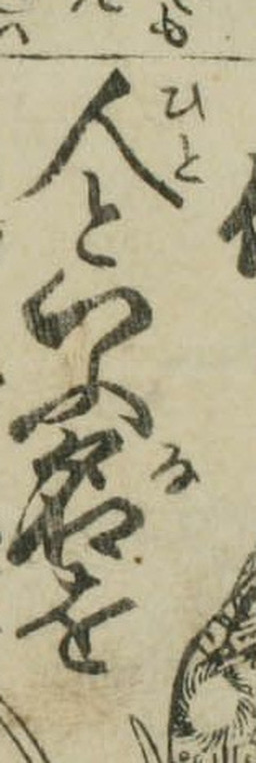人といふ名を
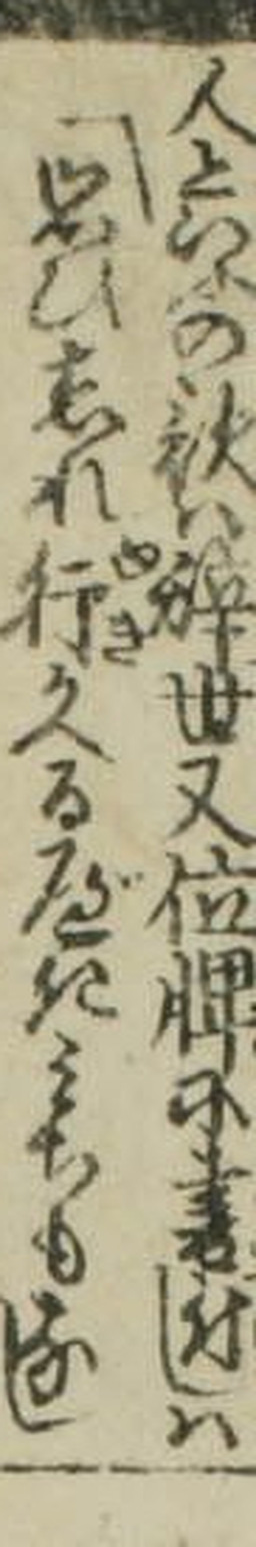〽思ひしれ行かへるべきみちもなし
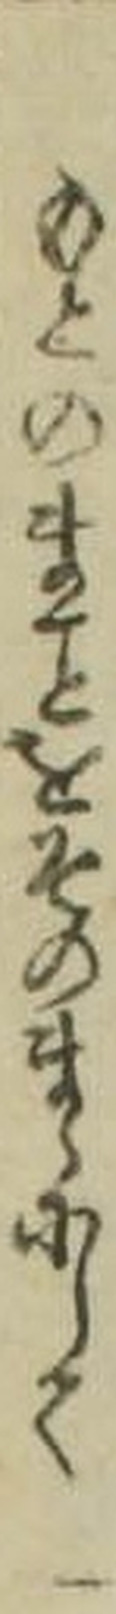もとのまことをそのまゝにして
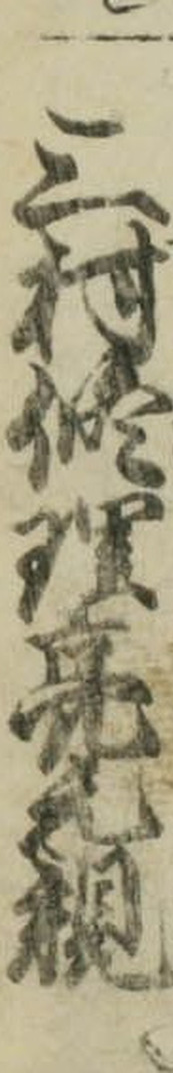三村修理亮元親
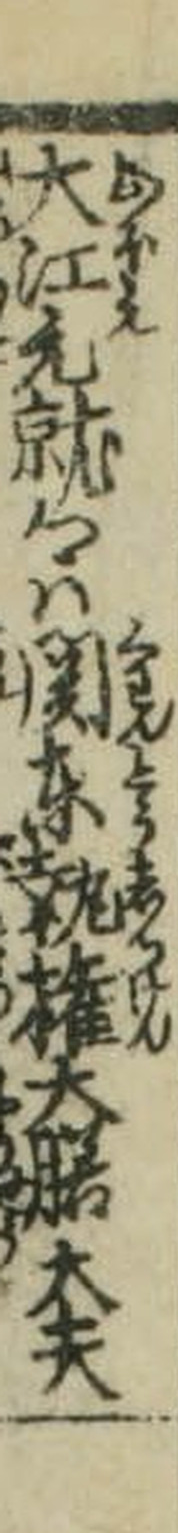大江元就卿は関東執権大膳大夫
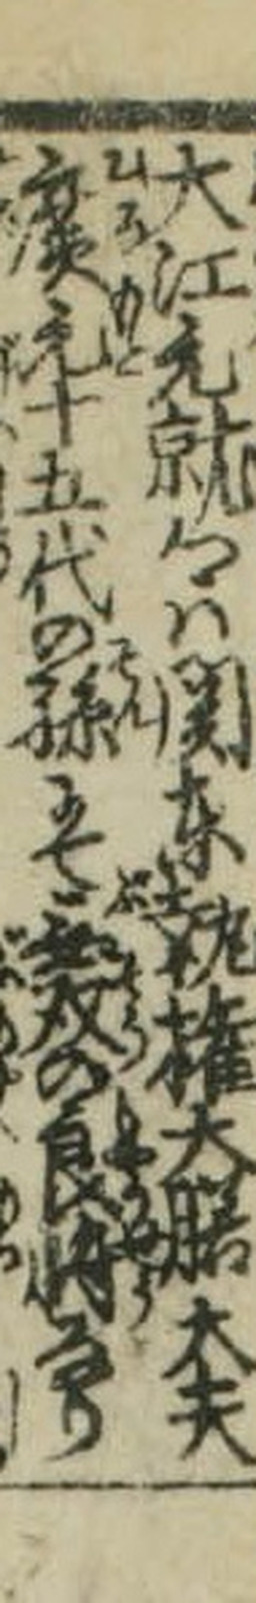廣元十五代の孫にて無双の良将なり
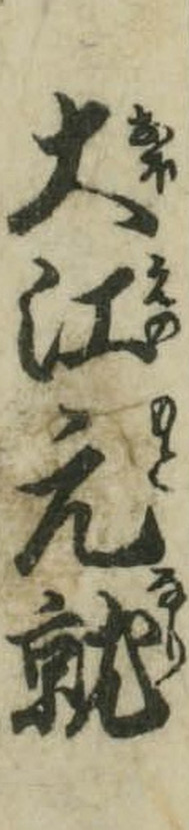大江元就
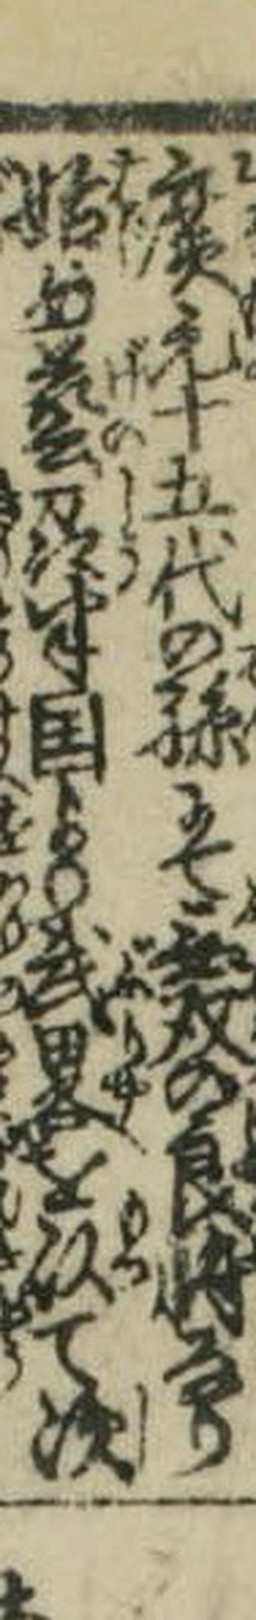始め芸州半国より武略を以て次
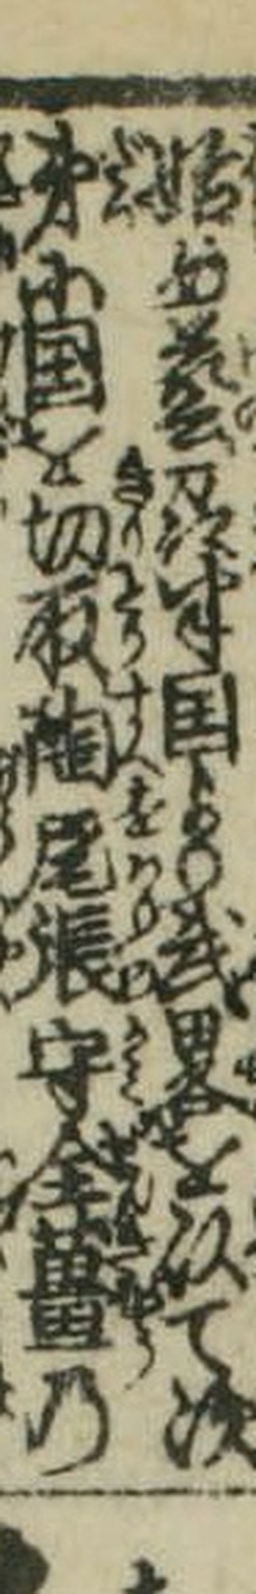第に国を切取陶尾張守全薑の
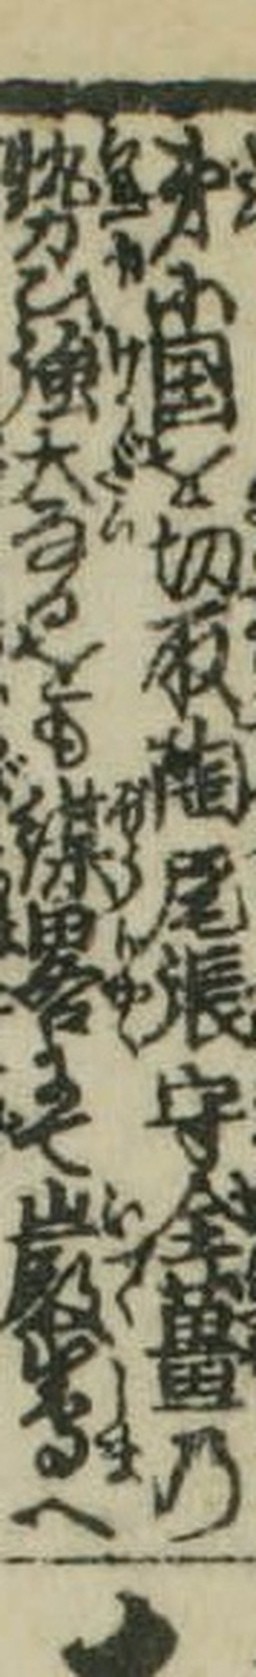勢ひ強大なるをも謀略にて厳嶋へ
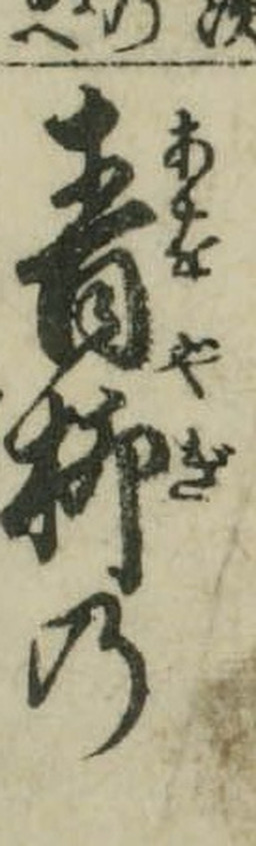青柳の
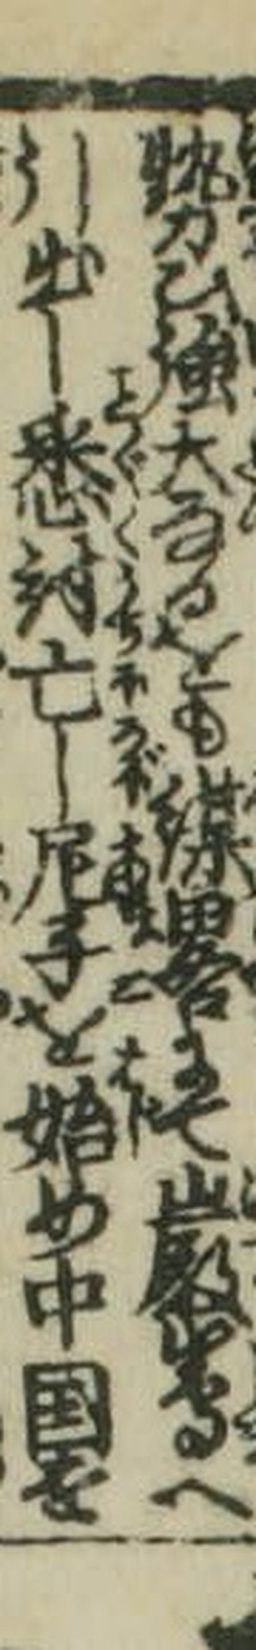引出し悉討亡し尼子を始め中国を
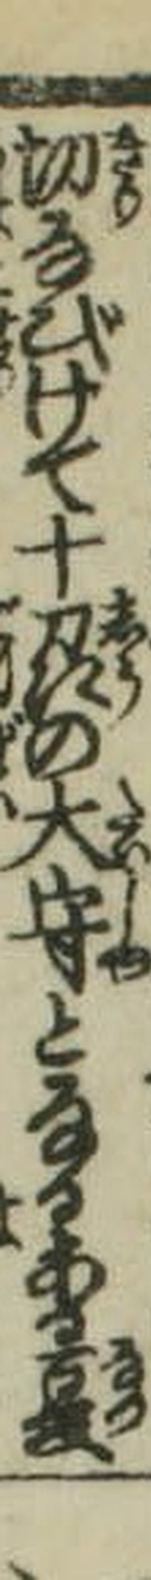切なびけて十州の大守となるある夏
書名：續英雄百人一首
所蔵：東京学芸大学附属図書館
